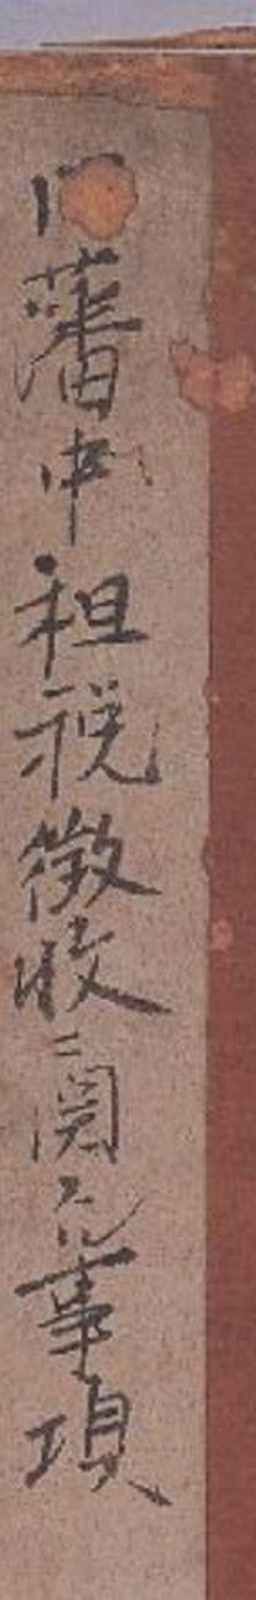旧藩中租税徴収ニ関スル事項

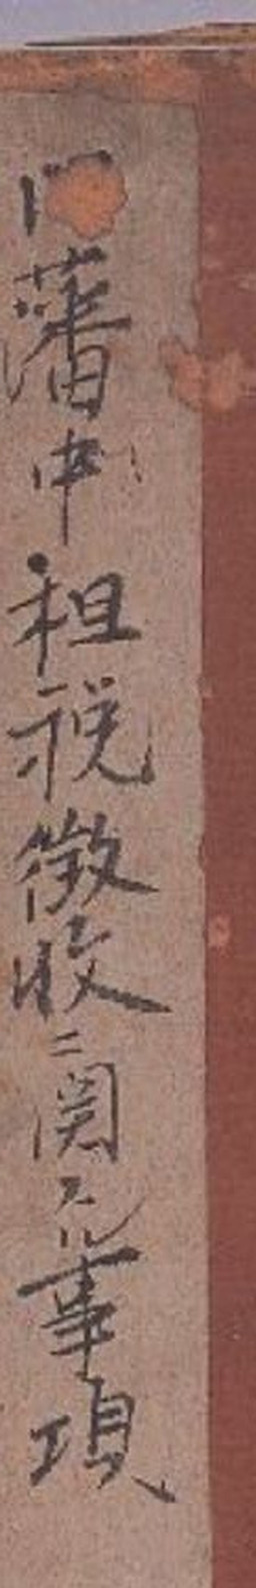旧藩中租税徴収ニ関スル事項

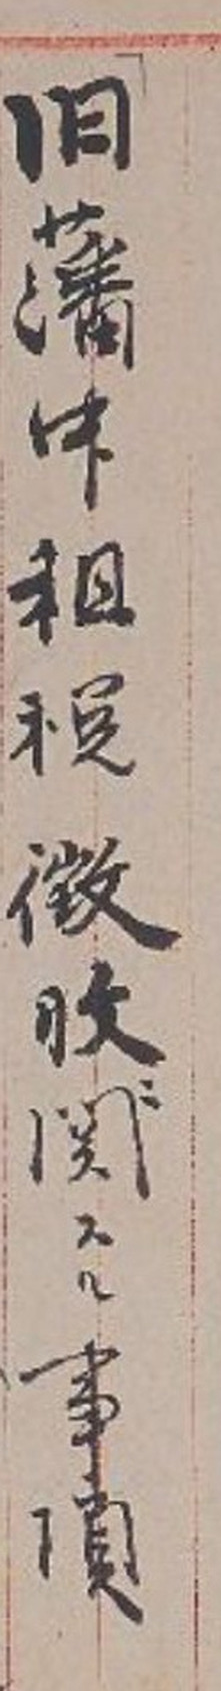旧藩中租税徴収ニ関スル事項
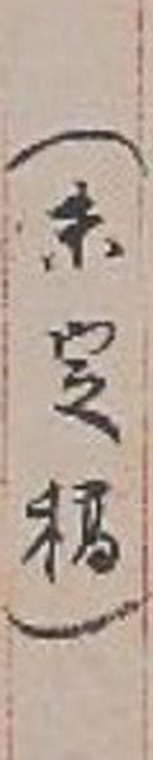(未定稿)

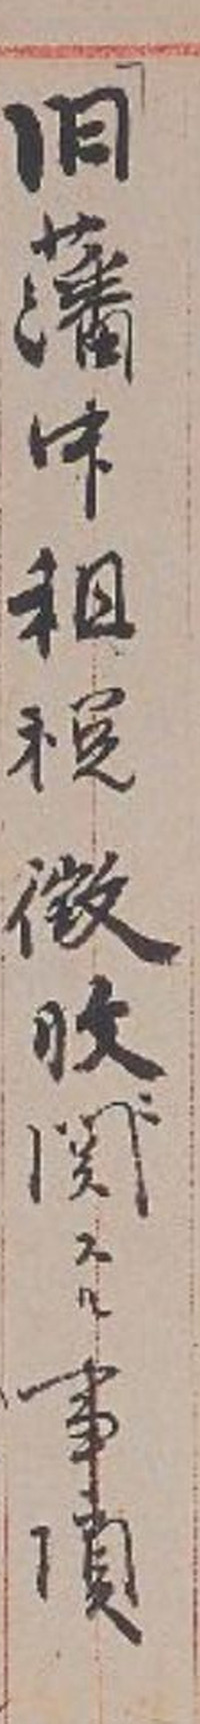旧藩中租税徴収ニ関スル事項

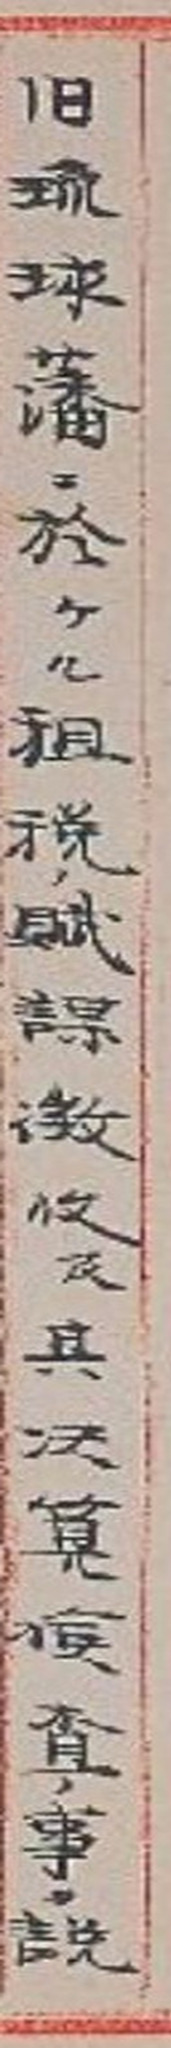旧琉球藩ニ於ケル租税ノ賦課徴収及其決算検査ノ事ヲ説
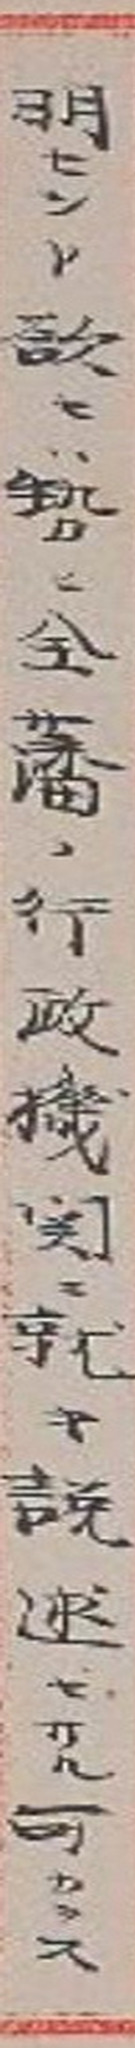明センと欲セハ勢ヒ全藩ノ行政機関ニ就キ説述セサル可カラス
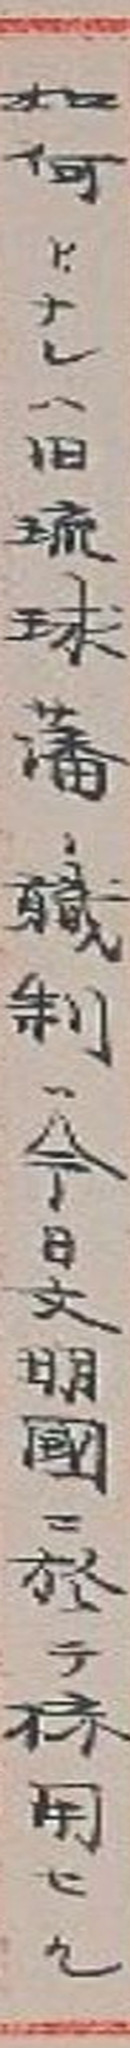如何申ナレハ旧琉球藩ノ職制ハ今日文明國ニ於テ採用セル
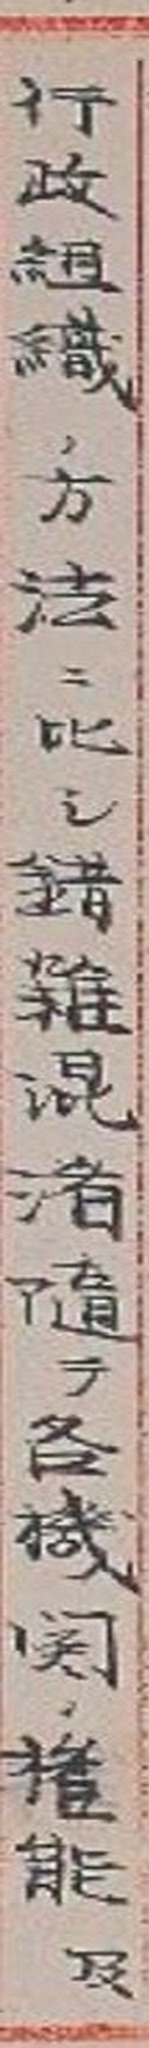行政組織ノ方法ニ比シ錯雑混淆隨テ各機関ノ権能及
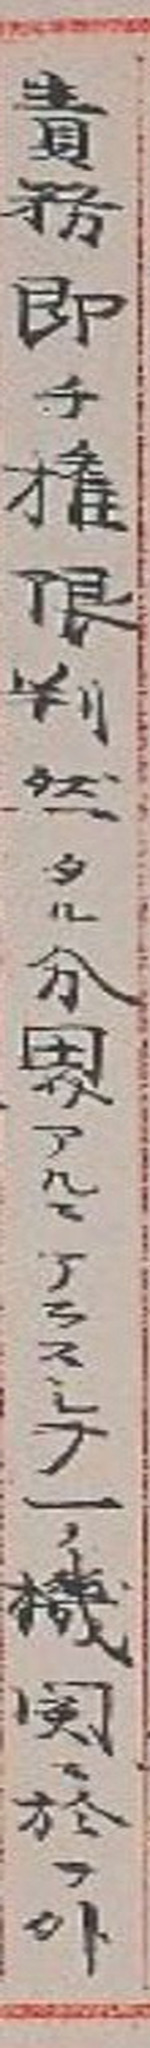責務即チ権限判然タル分界アルニアラスシテ一ノ機関ニ於テ外
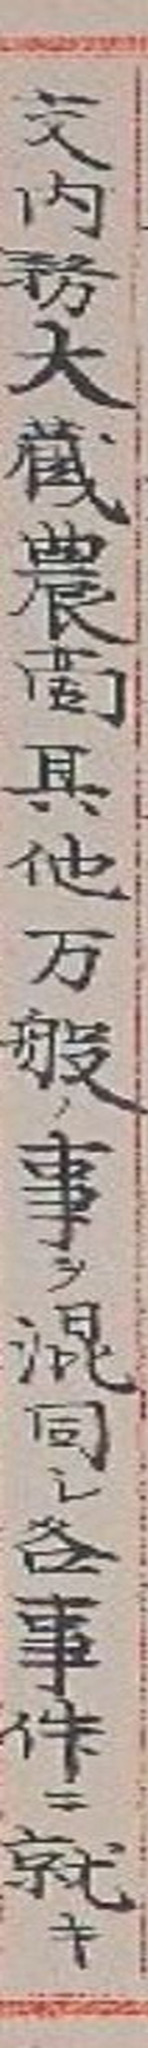交内務大蔵農商其他万般ノ事ヲ混同シ各事件ニ就キ
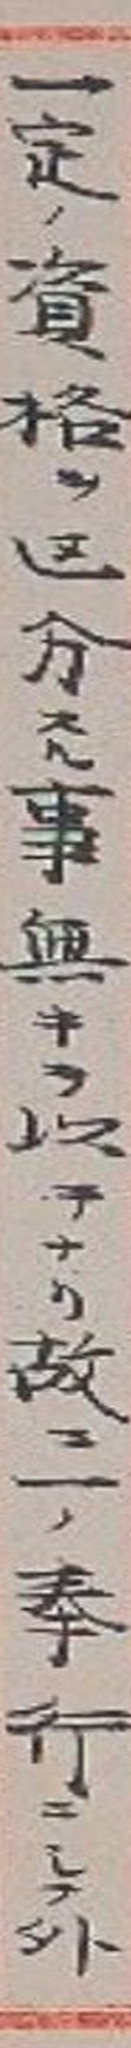一定ノ資格ヲ区分スル事無キヲ以テナリ故ニ一ノ奉行ニシテ外
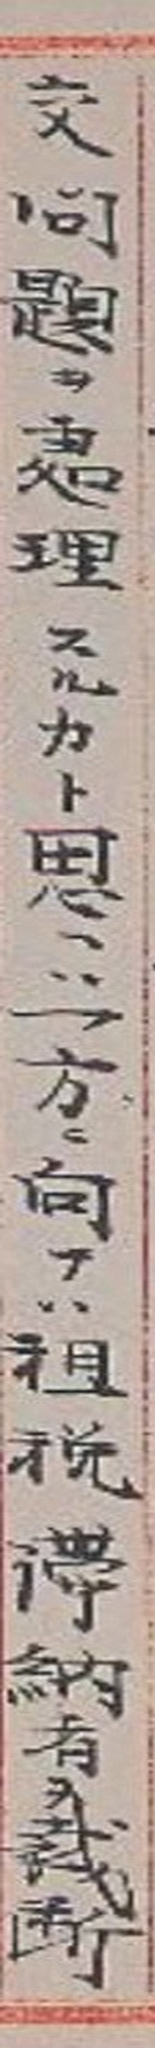交問題ヲ處理スルカト思ヘハ一方ニ向テハ租税滞納者ヲ裁断
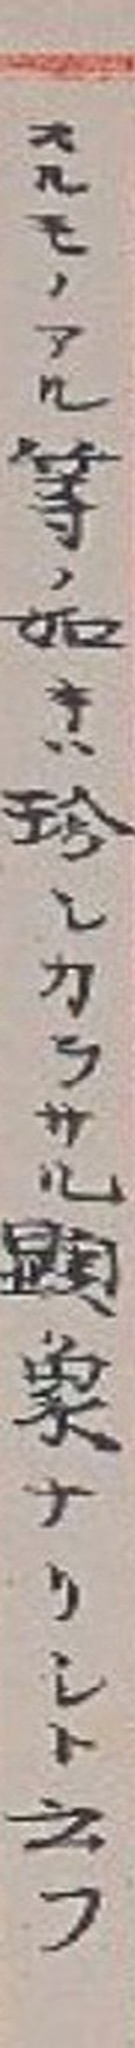スルモノアル等ノ如キハ珍シカラサル顕象ナリシト云フ
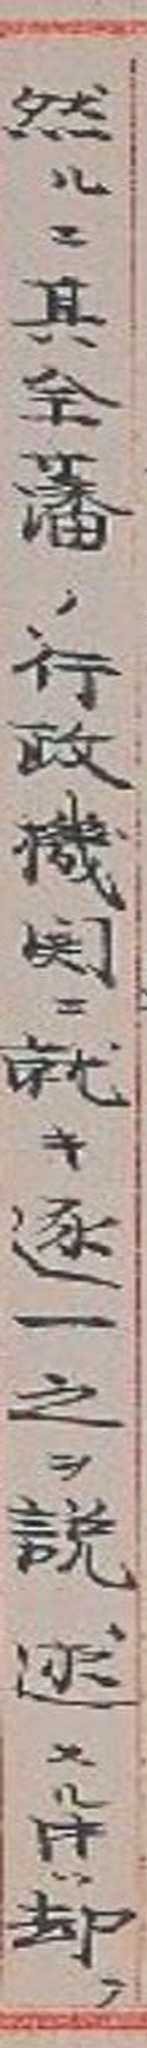然ルニ其全藩ノ行政機関ニ就キ逐一之ヲ説述スルトキハ却テ
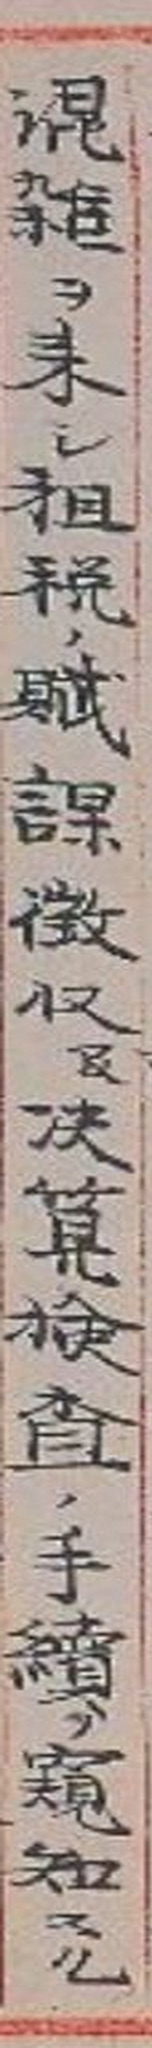混雑ヲ来シ租税ノ賦課徴収及決算検査ノ手續ヲ窺知スル
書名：旧藩中租税徴収ニ関スル事項
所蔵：University of the Ryukyus Library
